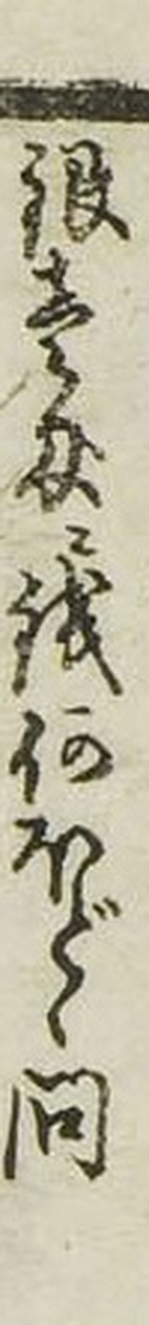銀壱匁に銭何ほどゝ問
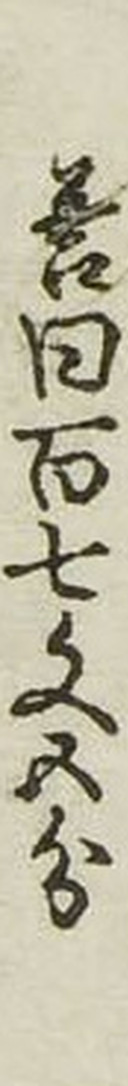答曰百七文五分
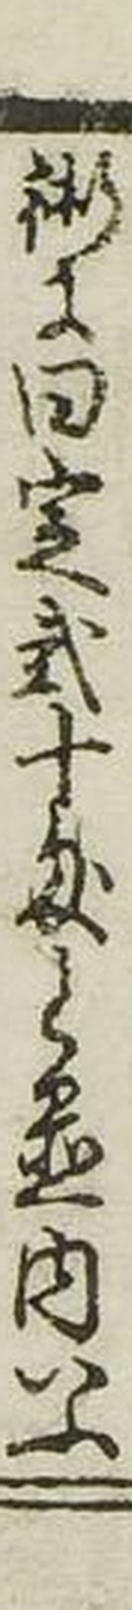術に曰定弐十匁と置内いふ
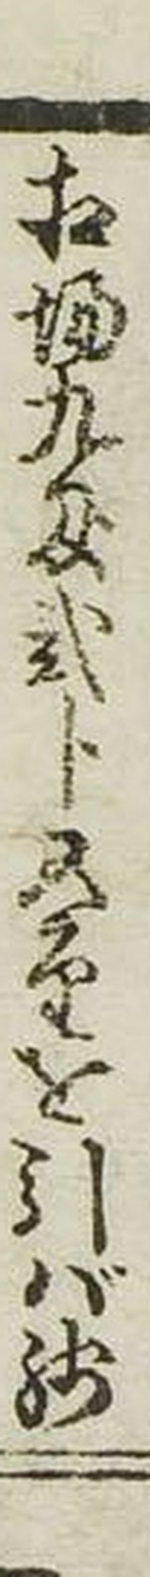相場九匁弐分五厘を引ば残
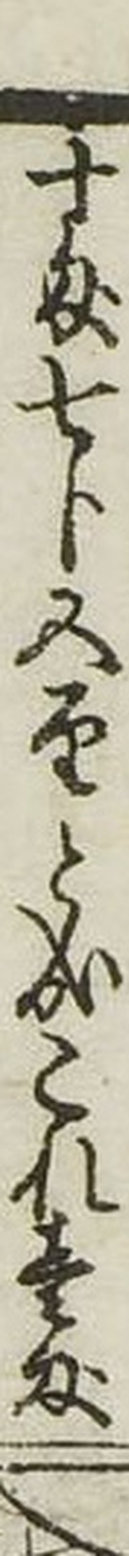十匁七分五厘と成これ壱匁
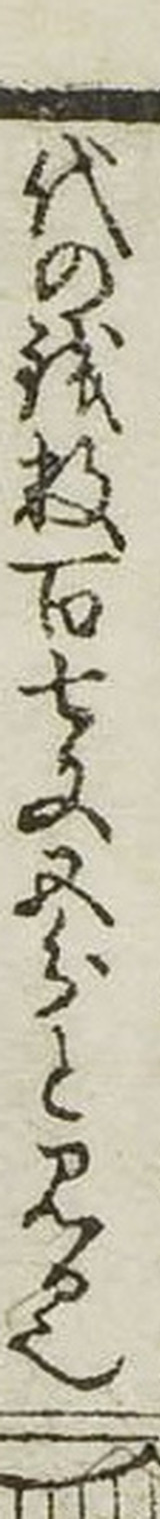代の残数百七文五分と見る也
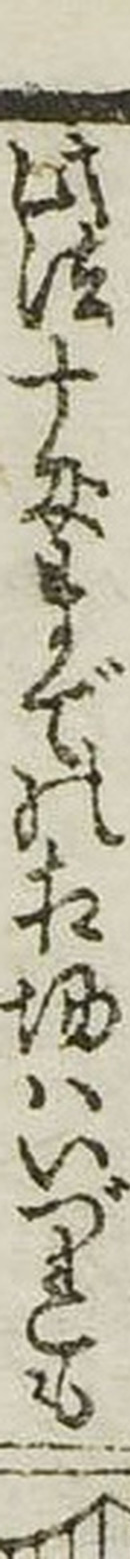此法十匁までの相場はいづれも
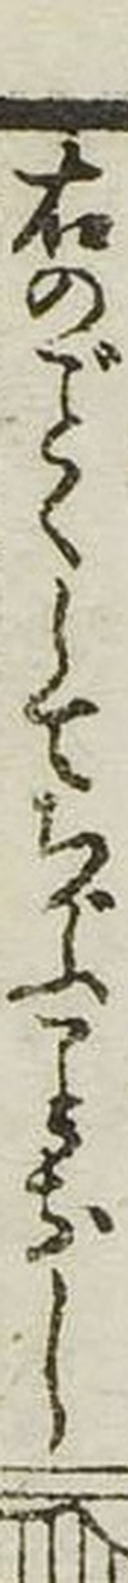右のごとくしてちがふことなし
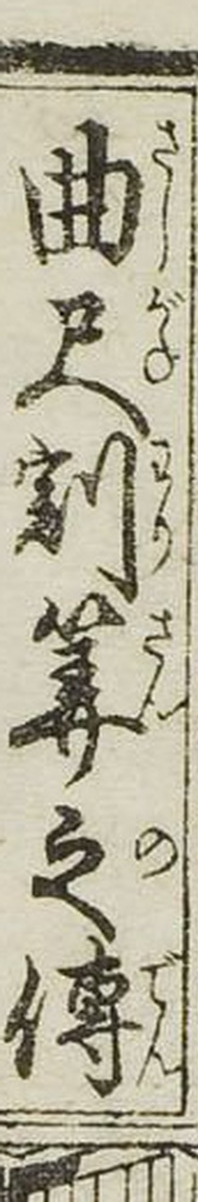曲尺割算之伝
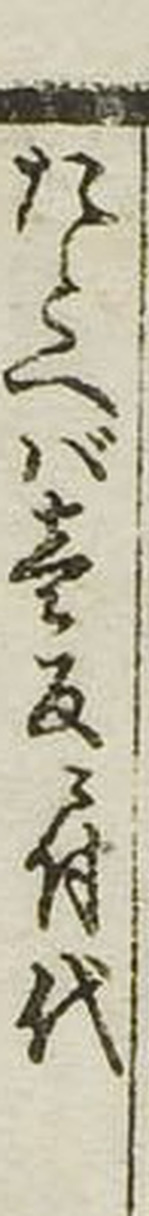たとへば壱反に付代
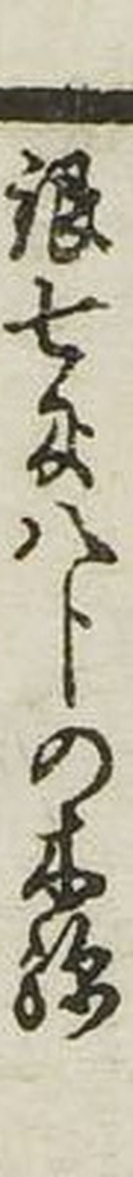銀七匁八分の木綿
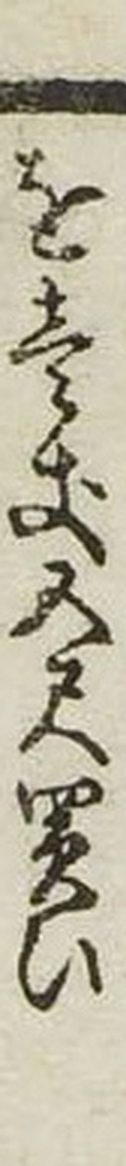を壱丈五尺買い
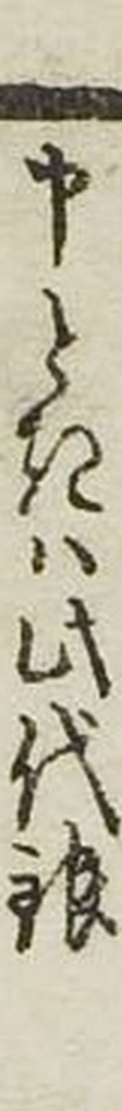申ときは此代銀
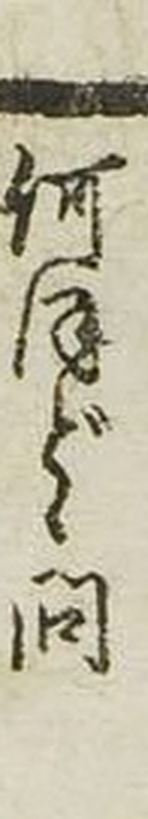何ほどゝ問
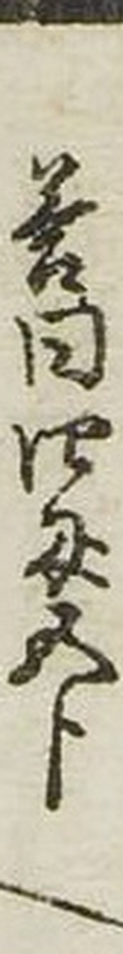答曰四匁五分
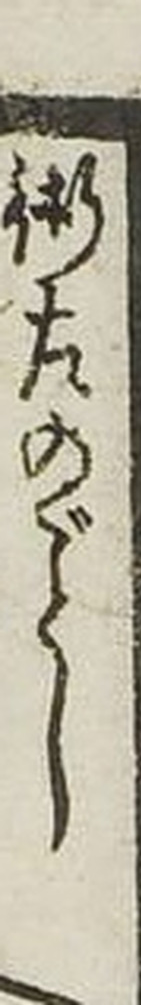術左のごとし
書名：商人書翰便覧
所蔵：東京学芸大学教育コンテンツアーカイブ
